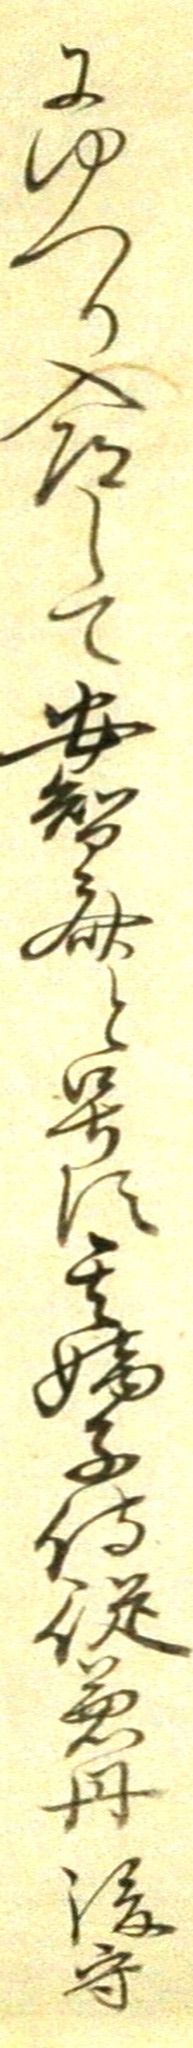にゆつり入道して安智斎と号す其嫡子侍従兼丹後守
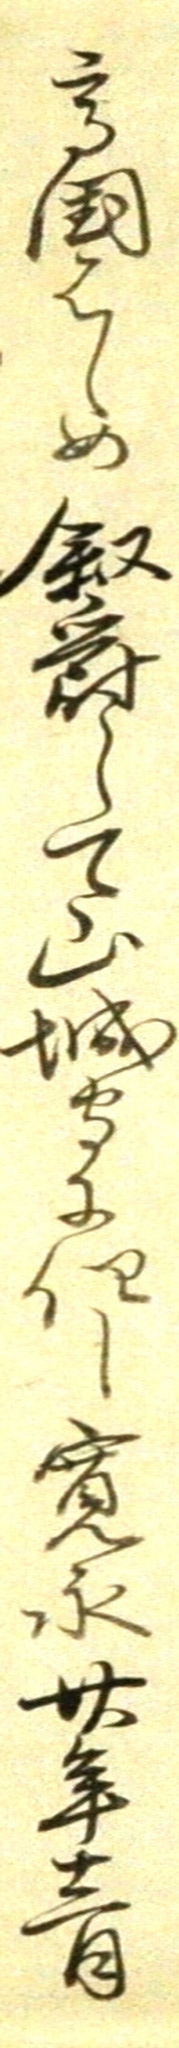高国はしめ叙爵して山城守に任し寛永廿年十二月
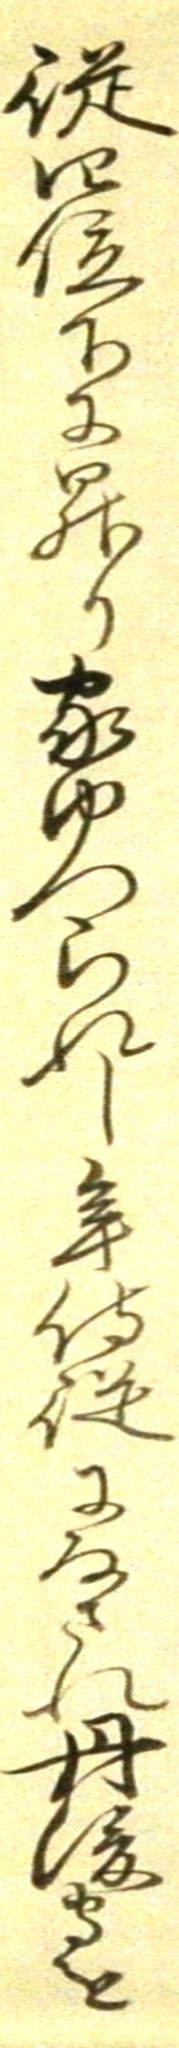従四位下に昇り家ゆつられし年侍従になされ丹後守を
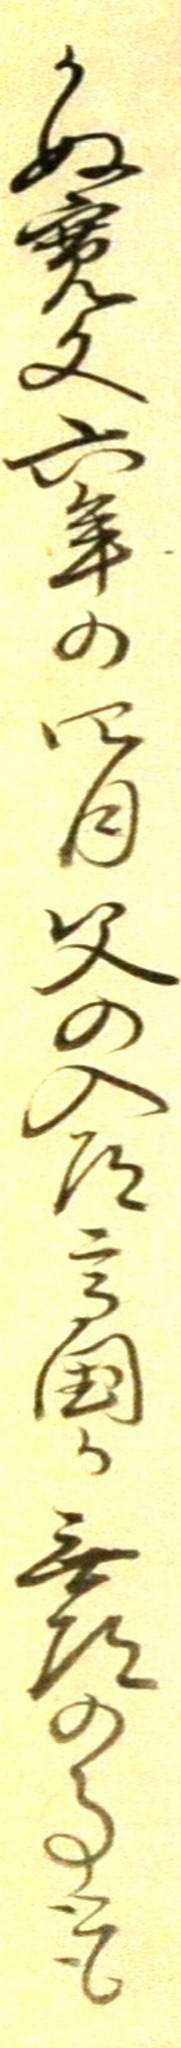かぬ寛文六年の四月父の入道高国か無道の事とも

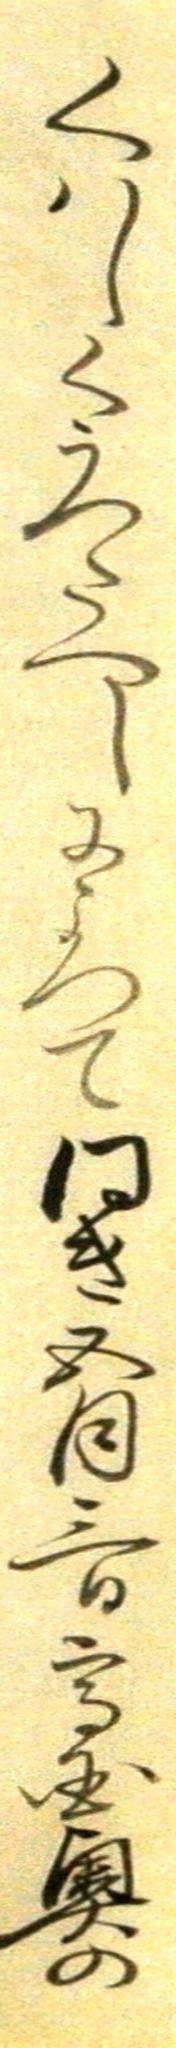くはしくうつたへしによつて同き五月三日高国奥の
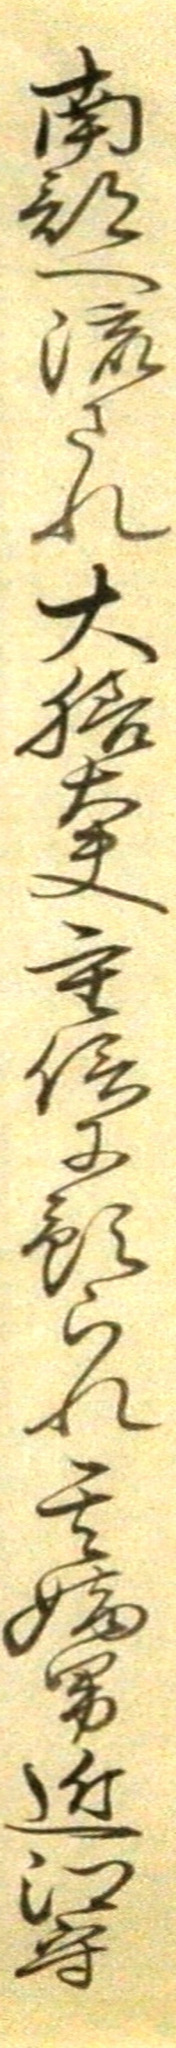南部へ流され大膳大夫重信に預られ其嫡男近江守
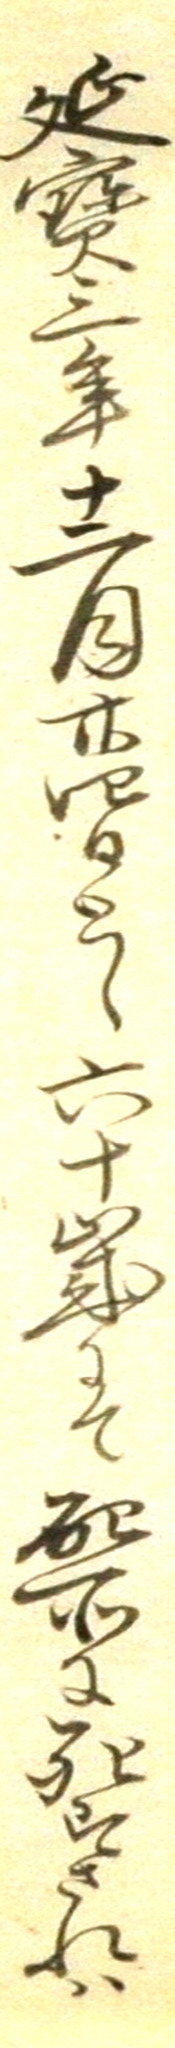延宝三年十二月廿四日とし六十歳にて配所に死すされは
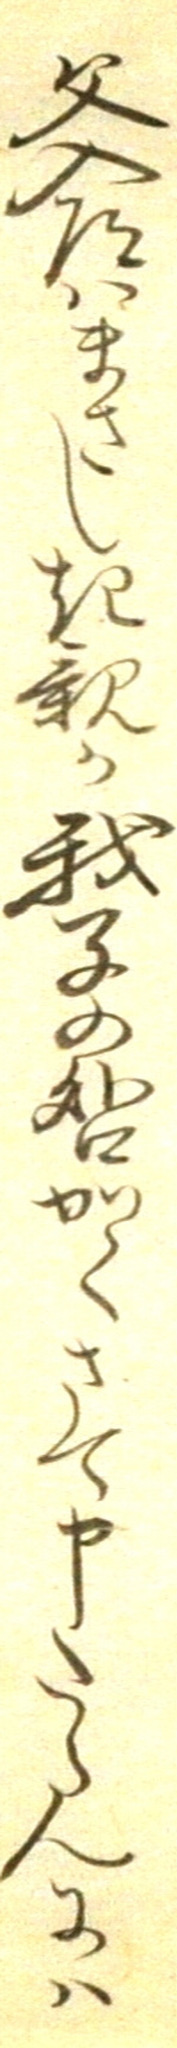父入道はまさしき親か我子の咎かくさて申たらんには
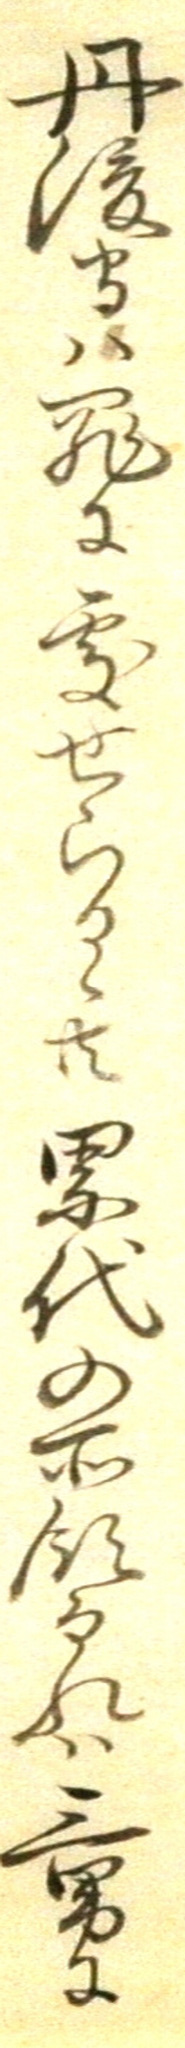丹後守は罪に処せらるゝ共累代の所領なれは三男に
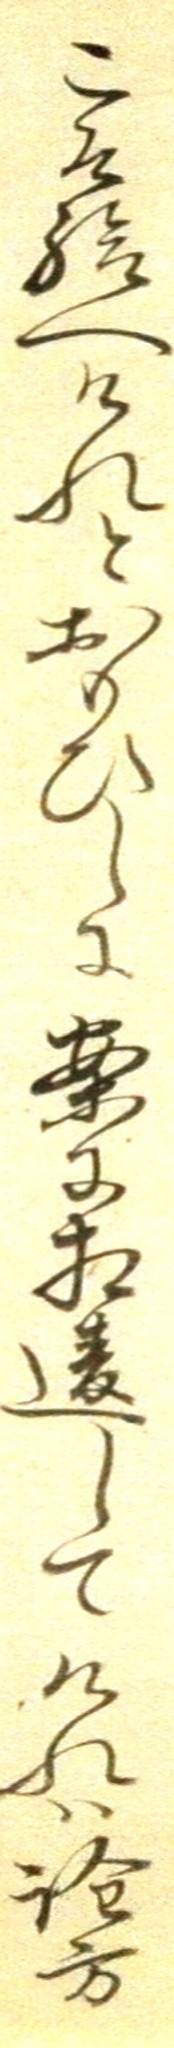こそ給へけれとおもひしに案に相違してけれは詮方
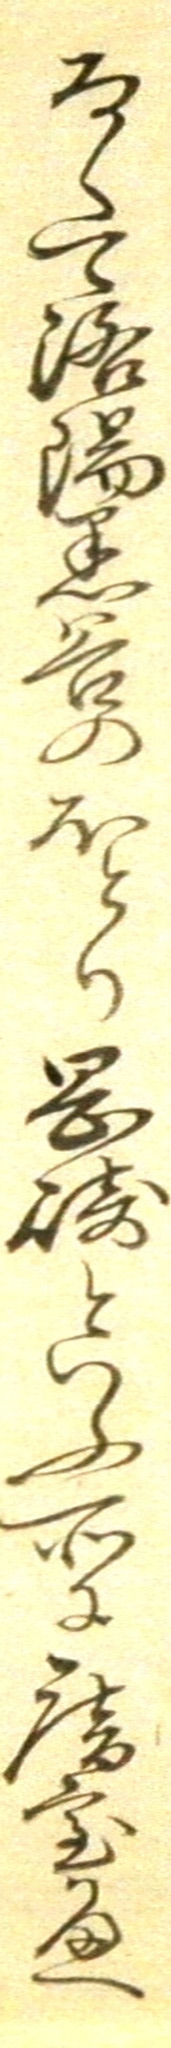なくて洛陽黒谷のほとり岡崎といふ所に庵室かまへ
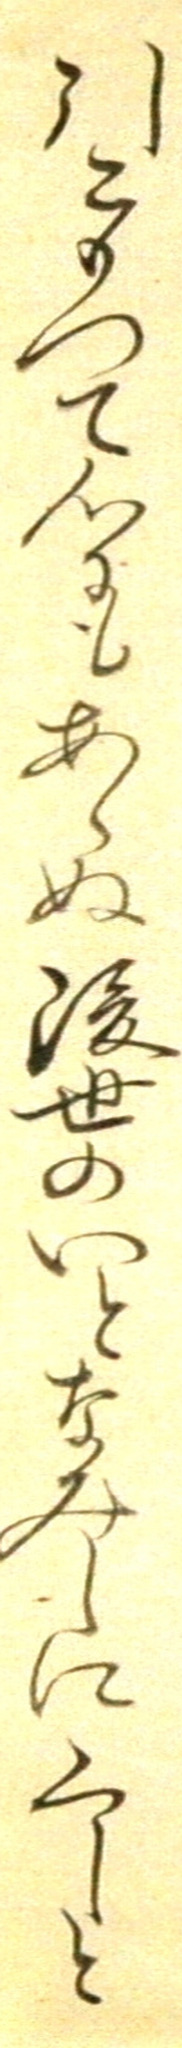引こもつて心にもあらぬ後世のいとなみしにくしと
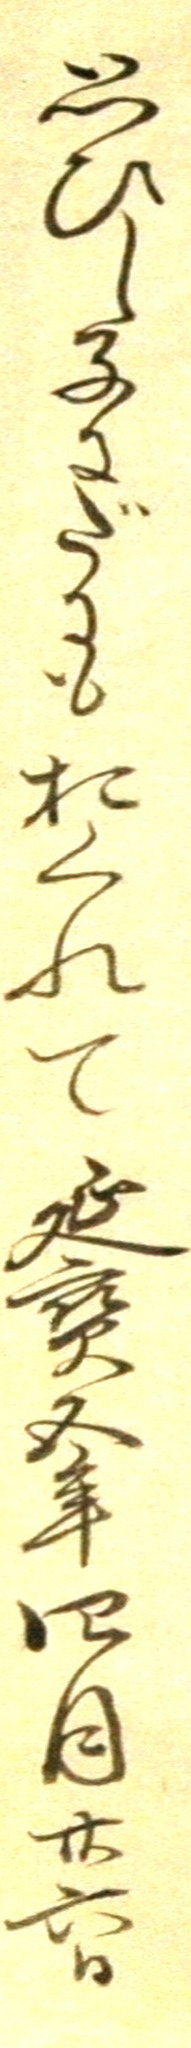思ひし子にだにもおくれて延宝五年四月廿六日

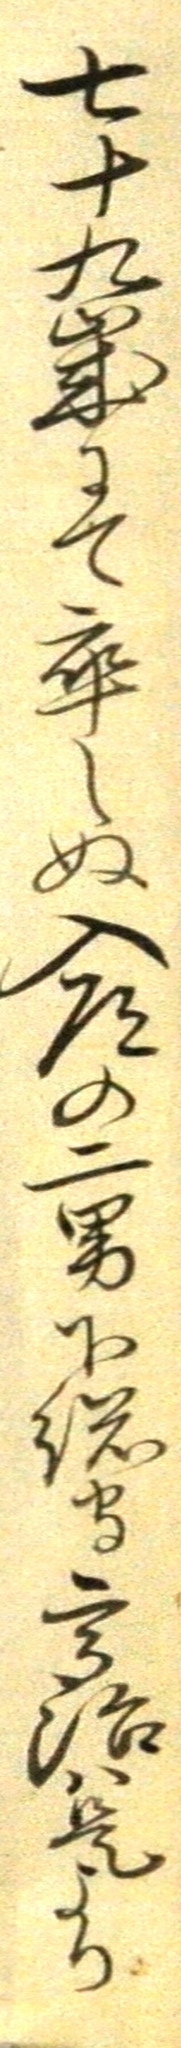七十九歳にて卒しぬ入道の二男下総守高治は是より
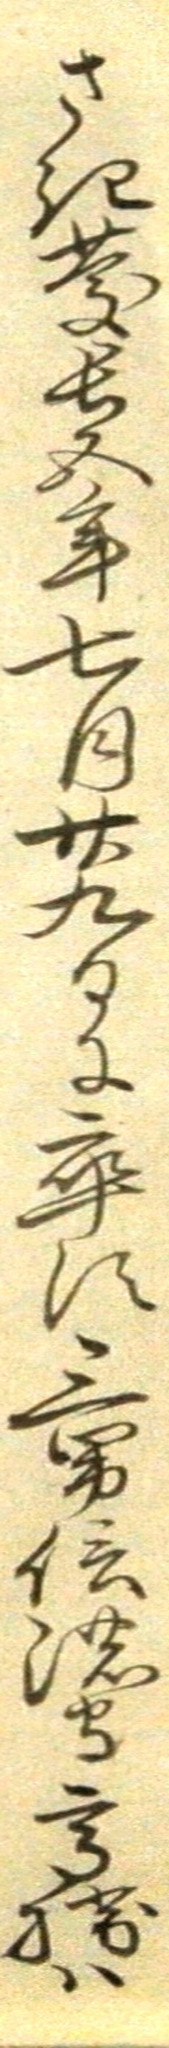さき慶長五七月廿九日に卒す三男信濃守高勝は
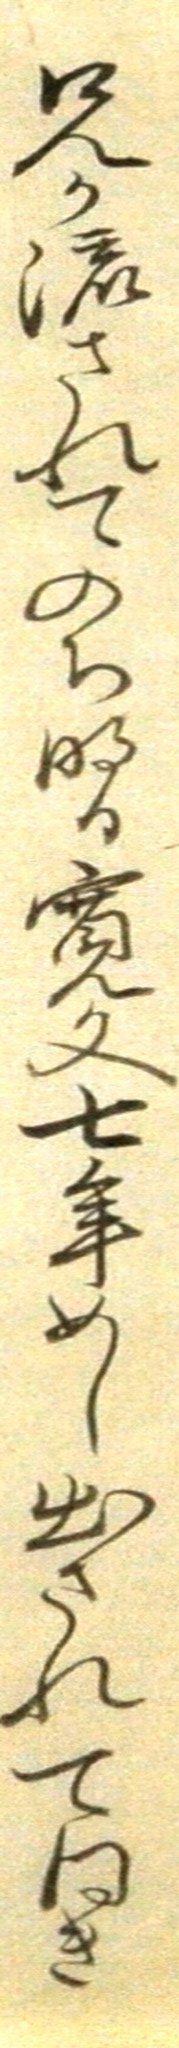兄か流されてのち明る寛文七年めし出されて同き
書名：藩翰譜（七・上）
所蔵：伊那市立高遠町図書館・合同会社AMANE
